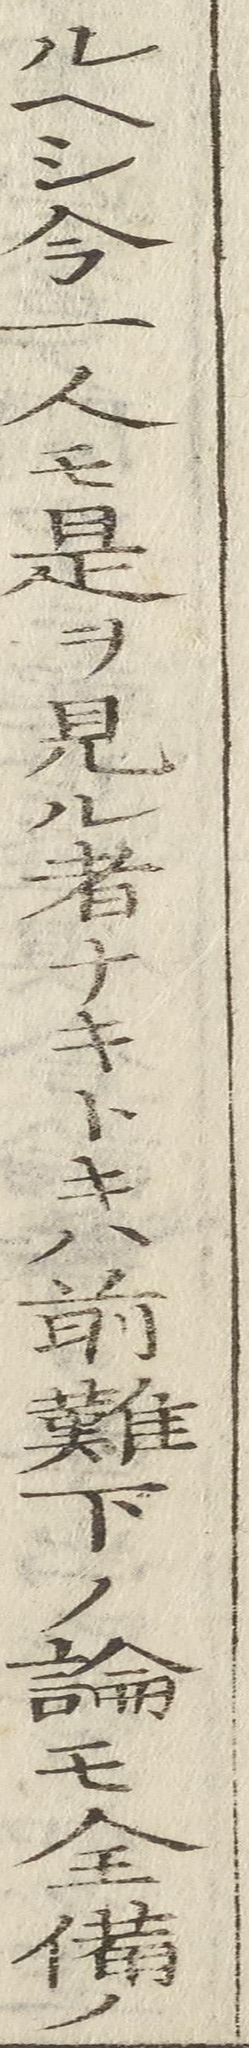ルヘシ今一人モ是ヲ見ル者ナキチキハ前難下ノ論モ全備ノ
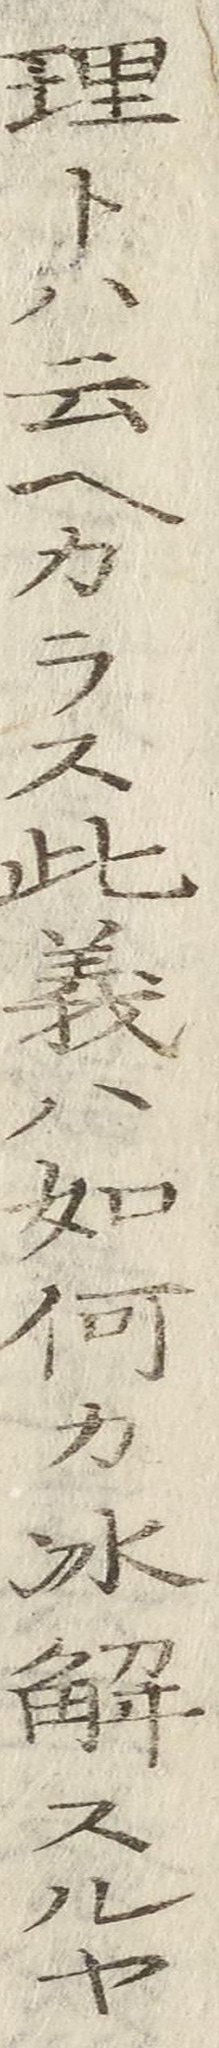理トハ云ヘカラス此義ハ如何カ氷解スルヤ
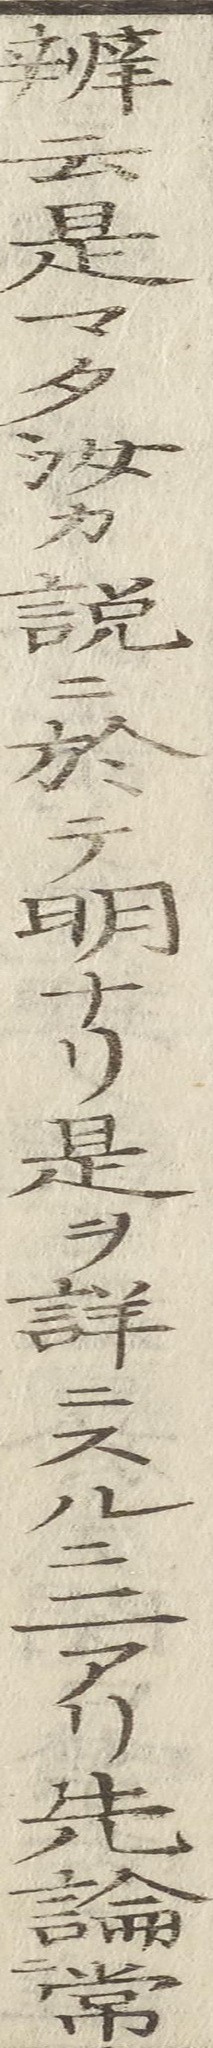弁云是マタ汝カ説ニ於テ明ナリ是ヲ詳ニスルニニアリ先論ニ常
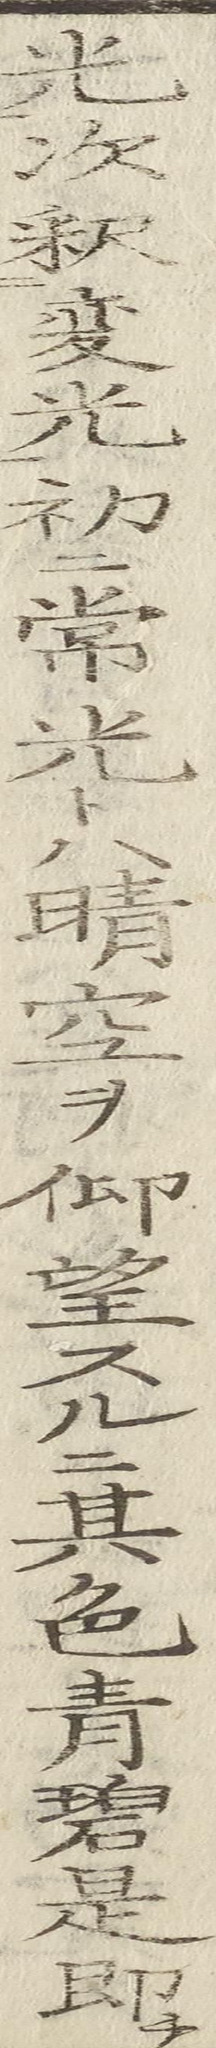光次釈ニ変光初ニ常光トハ晴空ヲ仰望スルニ其色青碧是即チ
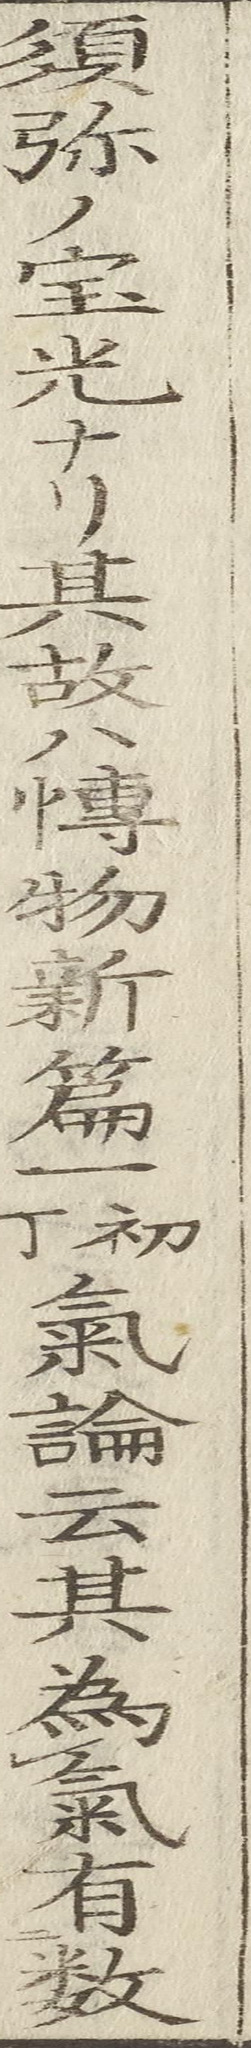須弥ノ宝光ナリ其故ハ慱物新篇一初丁気論云其為気有ニ数
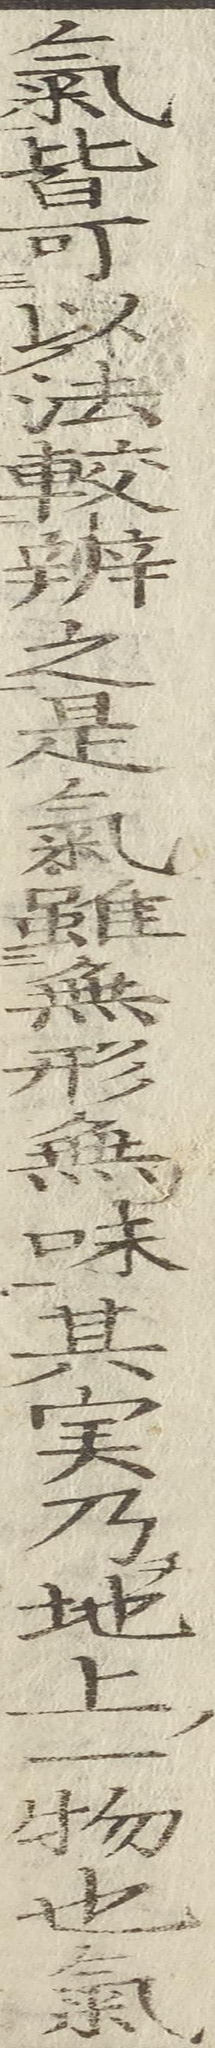気皆可以法較ニ弁之是気雖ニ無形無味其実乃地上一物也気

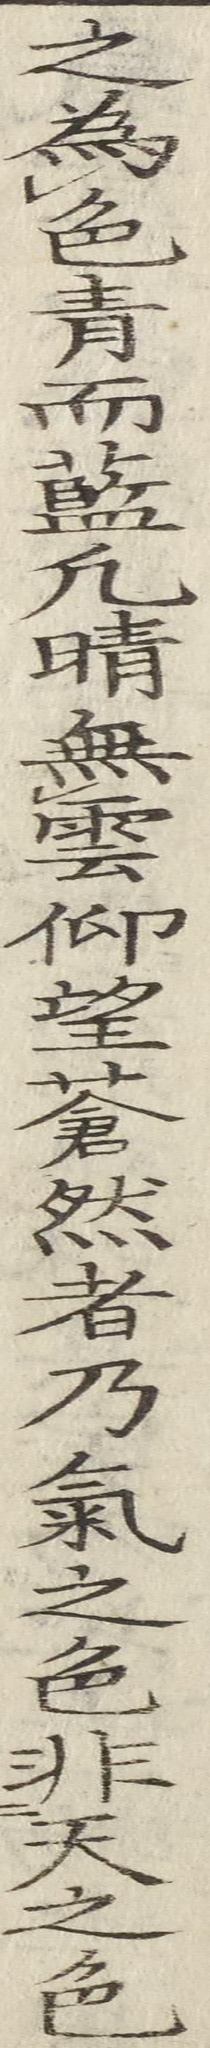之為色青而藍凡晴無雲仰望蒼然者乃気之色非ニ天之色
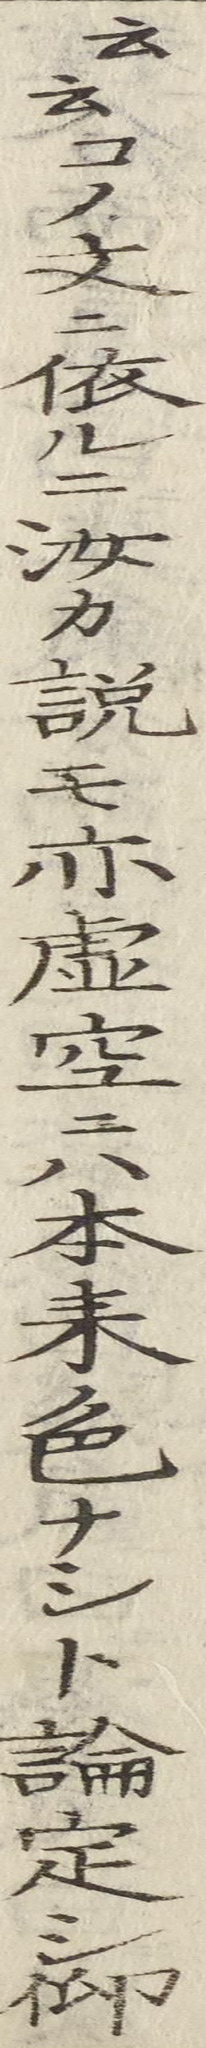云云コノ文ニ依ルニ汝カ説モ亦虚空ニハ本来色ナシト論定シ仰
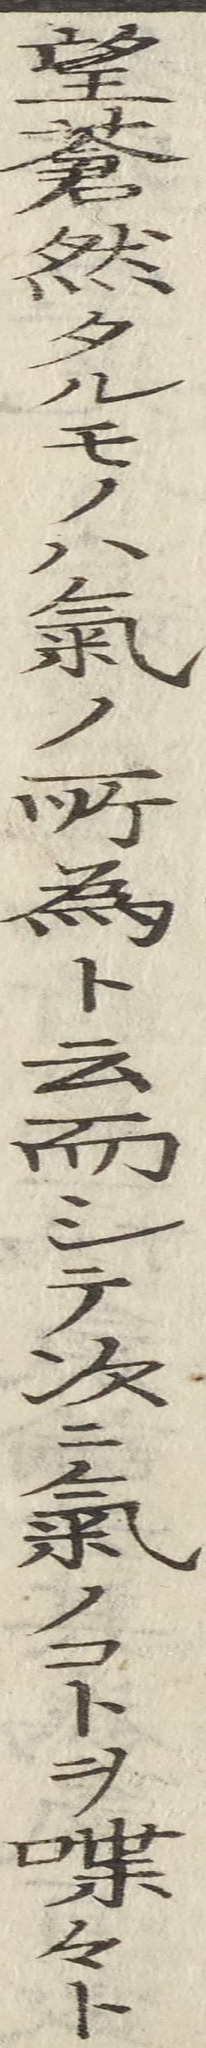望蒼然タルモノハ気ノ所為ト云而シテ次ニ気ノコトヲ喋々ト
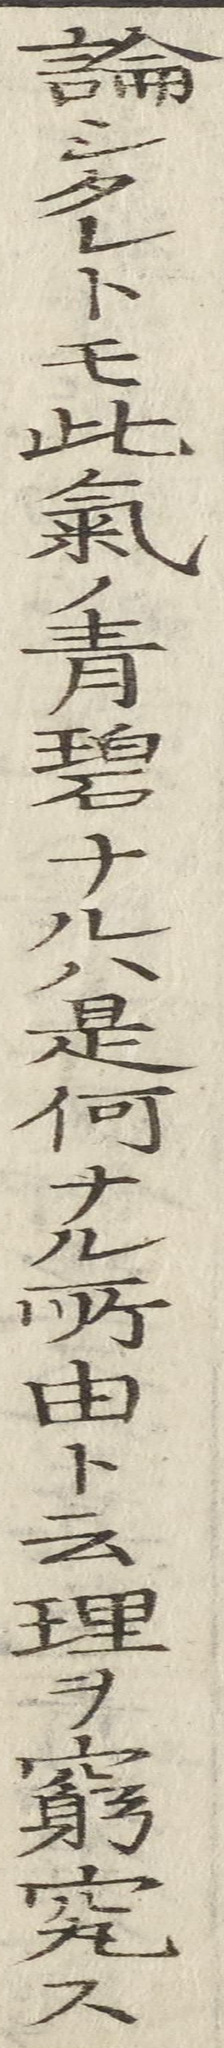論シタレトモ此気ノ青碧ナルハ是何ナル所由ト云理ヲ窮究ス
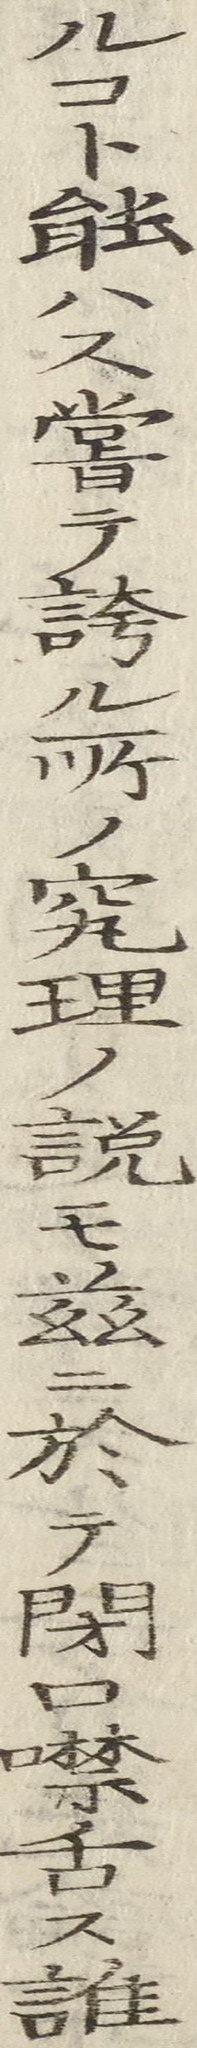ルコト能ハス嘗テ誇ル所ノ究理ノ説モ茲ニ於テ閉口噤舌ス誰
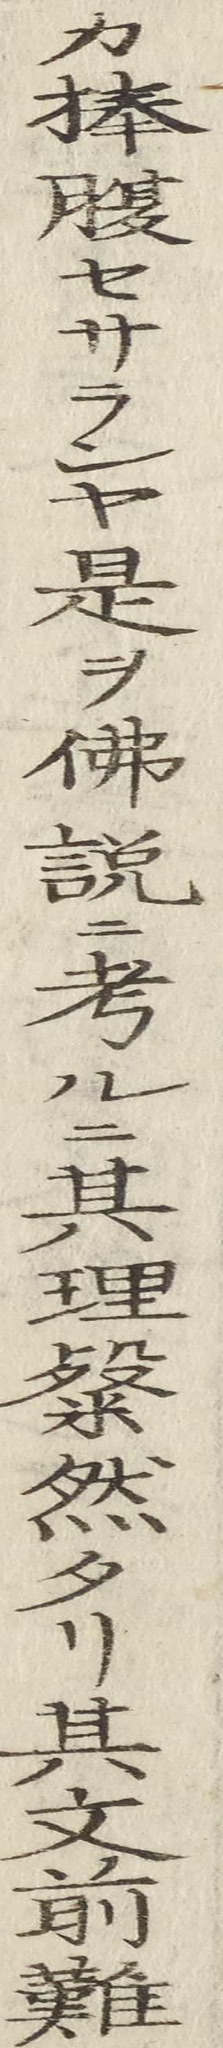カ捧腹セサランヤ是ヲ仏説ニ考ルニ其理粲然タリ其文前難
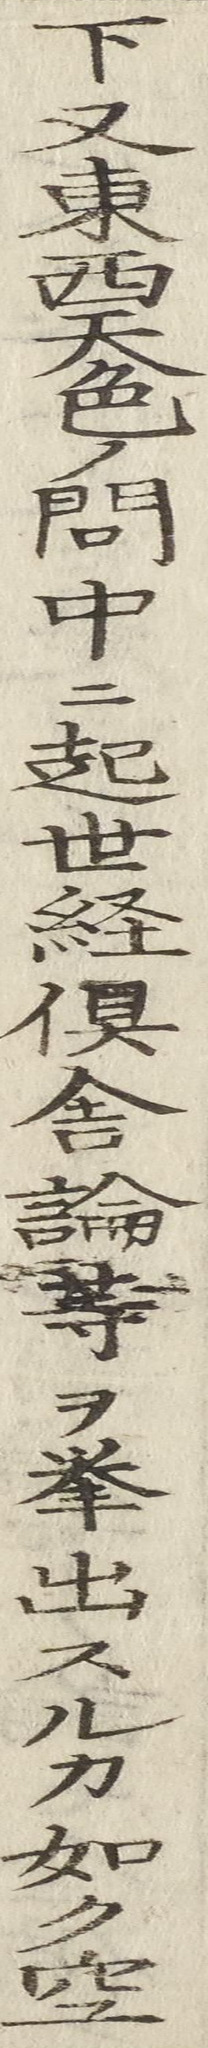下又東西天色ノ問中ニ起世経俱舎論等ヲ挙出スルカ如ク空
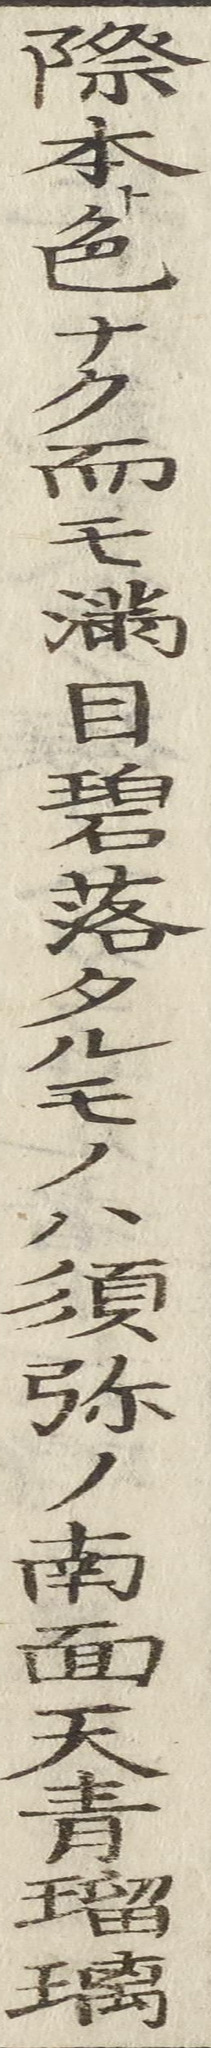際本色ナク而モ満目碧落タルモノハ須弥ノ南面天青瑠璃
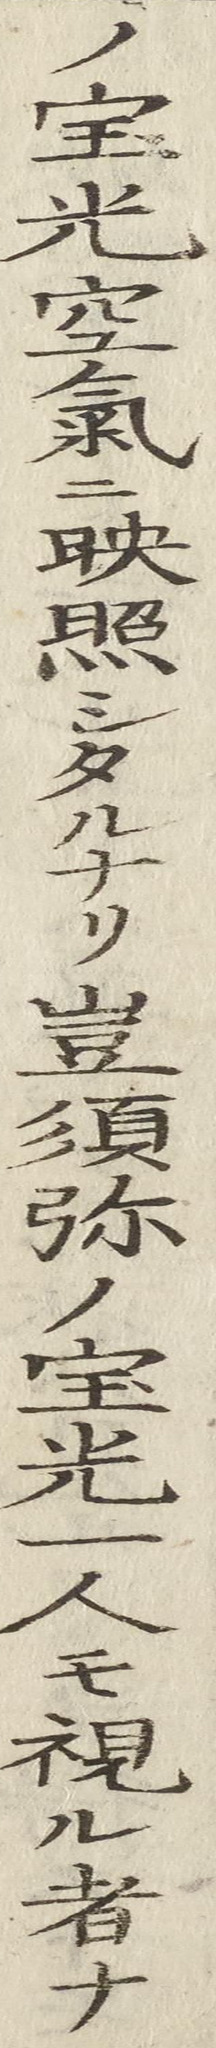ノ宝光空気ニ映照シタルナリ豈須弥ノ宝光一人モ視ル者ナ
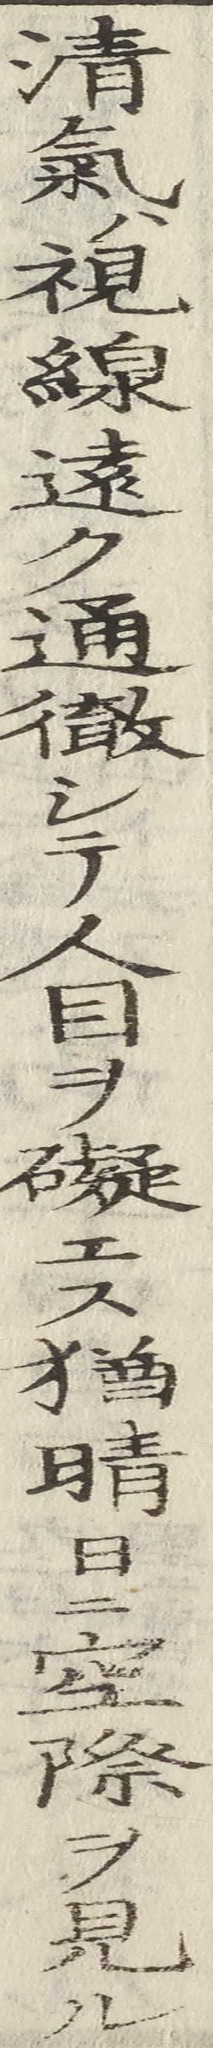清気視線遠ク通徹シテ人目ヲ礙エス猶晴日ニ空際ヲ見ル
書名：護法新論　二編　中
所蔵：東京大学地震研究所図書室 Earthquake Research Institute Library, The University of Tokyo, JAPAN
